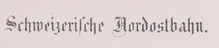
Schweizerische Nordostbahn.
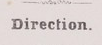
Direction.
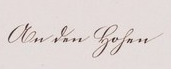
An den Hohen
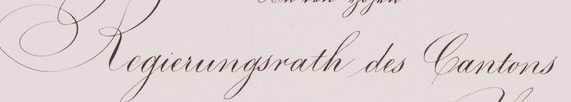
Regierungsrath des Cantons
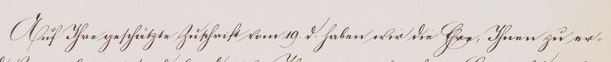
Auf Ihre geschätzte Zuschrift vom 19. d. haben wir die Ehre Ihnen zu er-
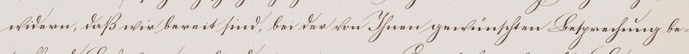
widern, daß wir bereit sind, bei der von Ihnen gewünschten Besprechung be-
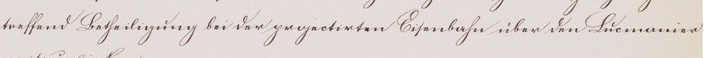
treffend Betheiligung bei der projectirten Eisenbahn über den Lucmanier
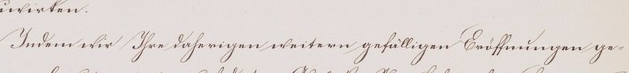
Indem wir Ihre daherigen weitern gefälligen Eröffnungen ge-
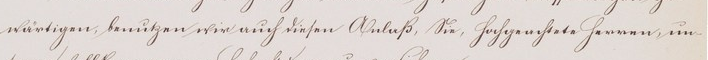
wärtigen, benützen wir auch diesen Anlaß, Sie, hochgeachtete Herren, un-
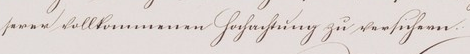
serer vollkommenen Hochachtung zu versichern.
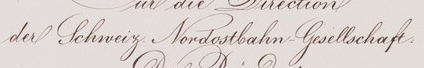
der Schweiz. Nordostbahn Gesellschaft
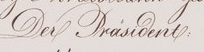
Der Präsident
